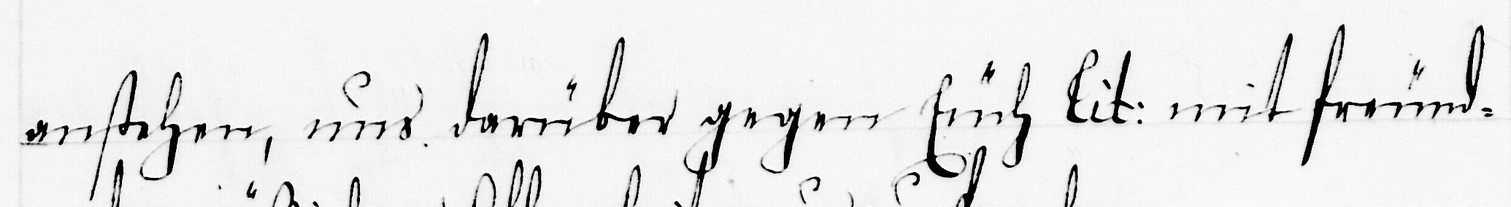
anstehen, uns darüber gegen Euch Tit: mit freund¬
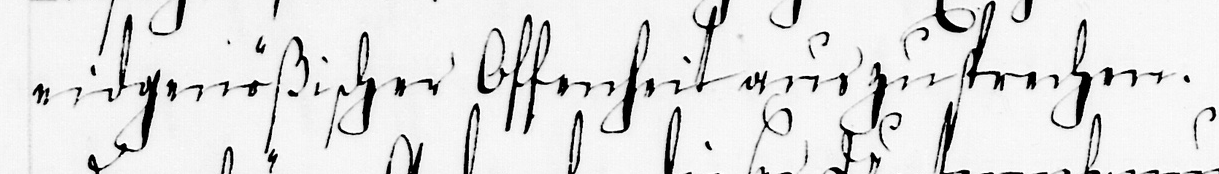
eidgenößischer Offenheit auszusprechen.
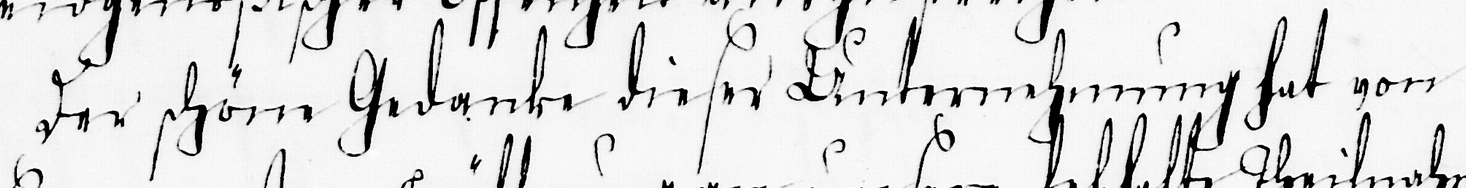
Der schöne Gedanke dieser Unternehmung hat von
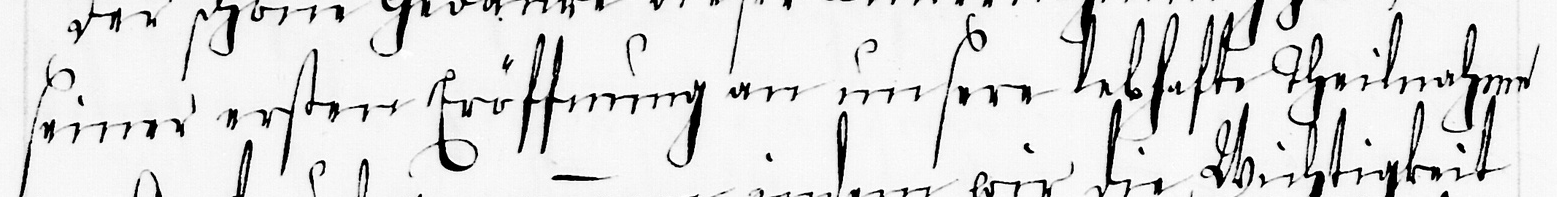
seiner ersten Eröffnung an unsere lebhafte Theilnahme
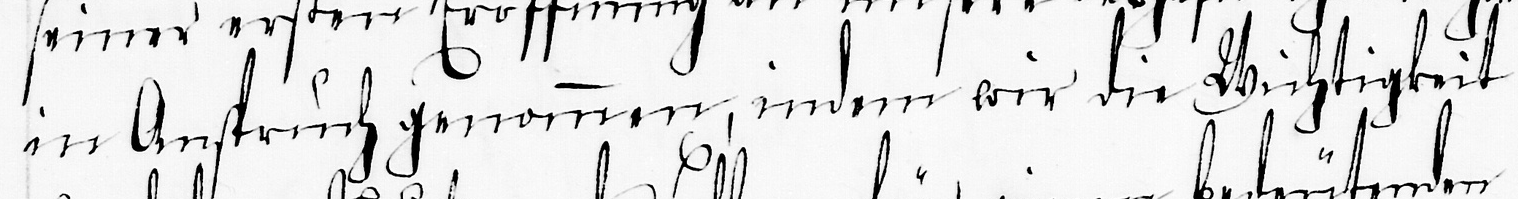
in Anspruch genommen, indem wir die Wichtigkeit
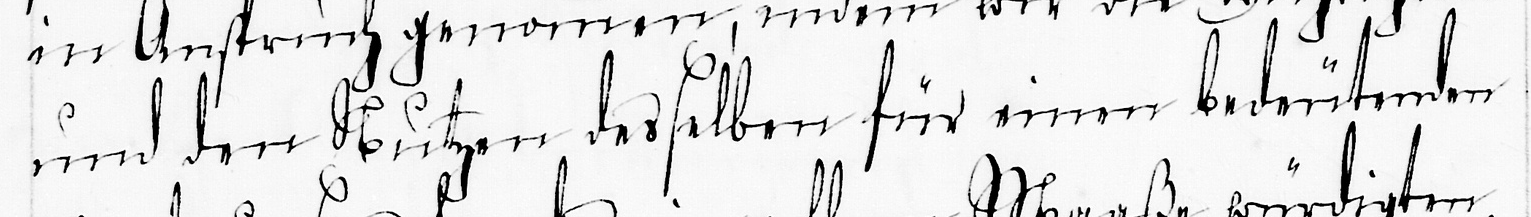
und den Nutzen desselben für einen bedeutenden
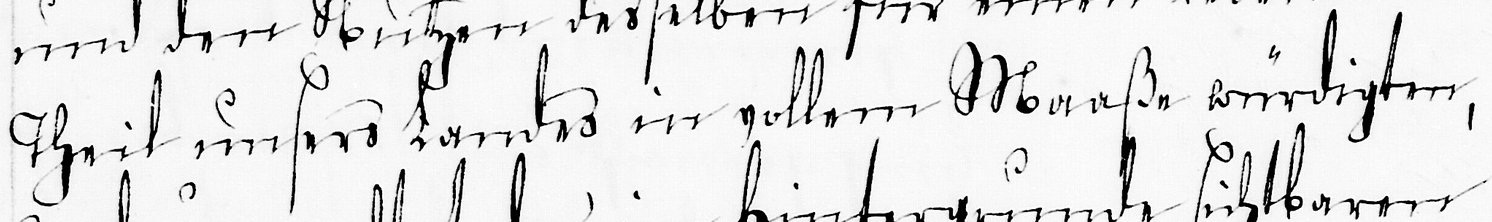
Theil unsers Landes in vollem Maaße würdigten,
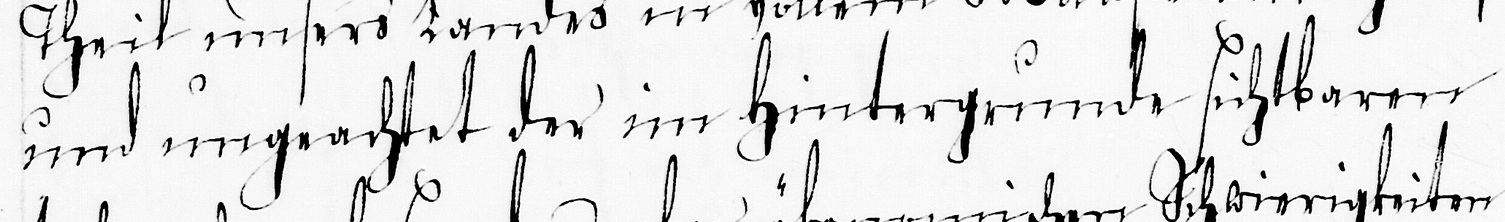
und ungeachtet der im Hintergrunde sichtbaren
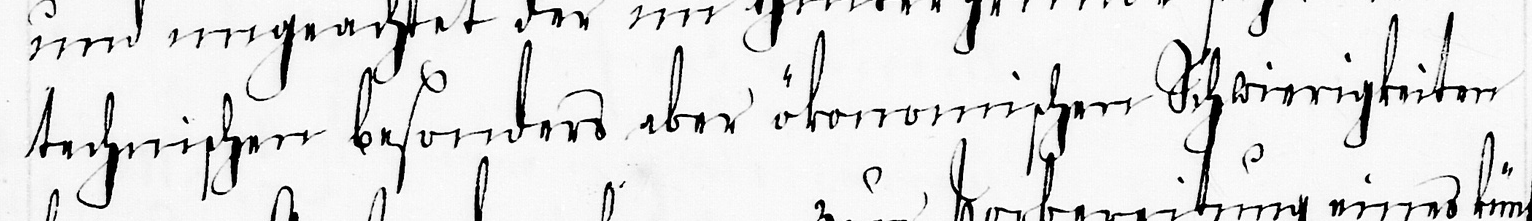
technischen besonders aber ökonomischen Schwierigkeiten
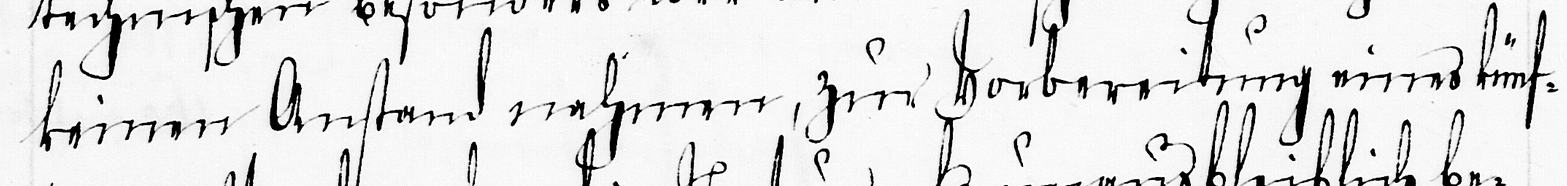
keinen Anstand nahmen, zur Vorbereitung eines künf¬
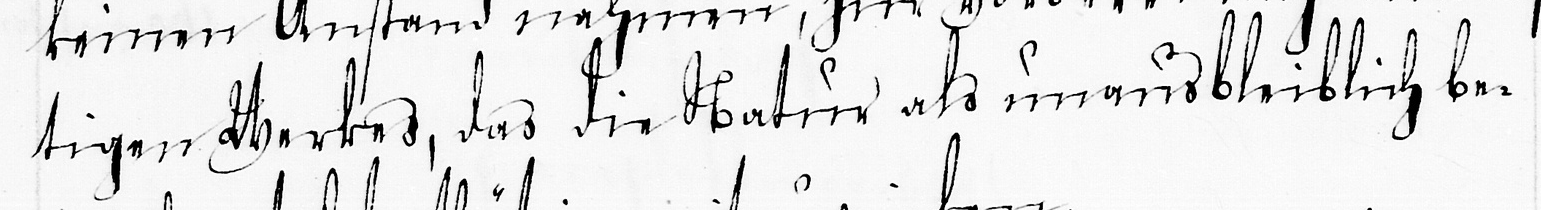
tigen Werkes, das die Natur als unausbleiblich be¬
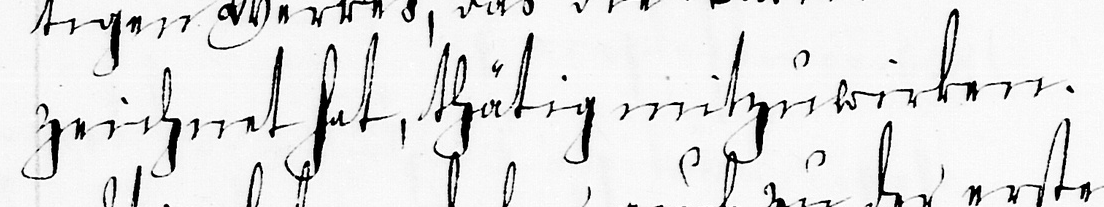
zeichnet hat, thätig mitzuwirken.
